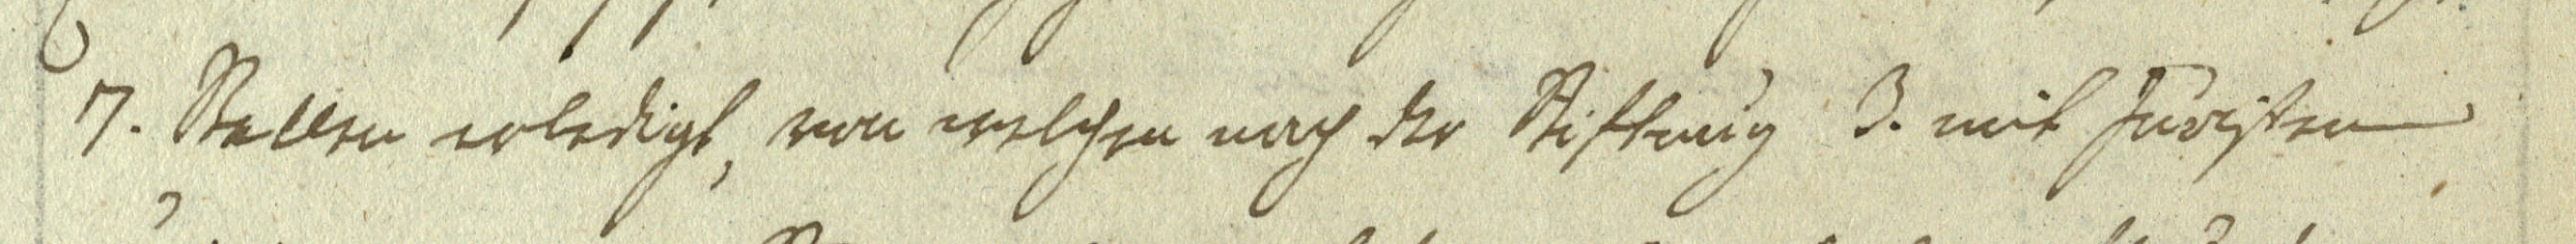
7. Stellen erledigt, von welchen nach der Stiftung 3. mit Juristen
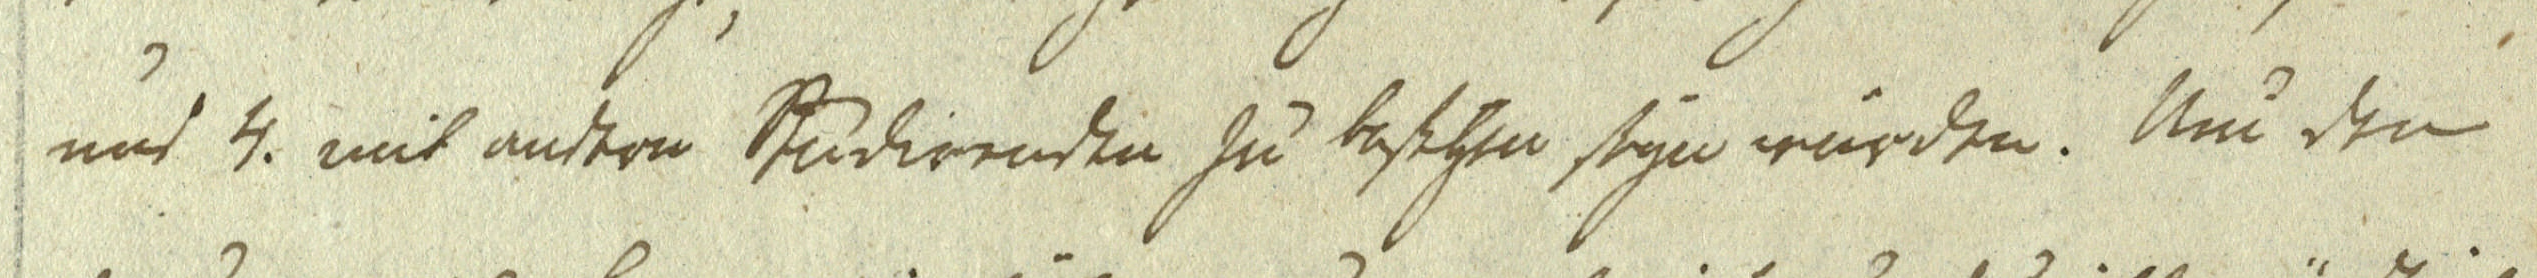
und 4. mit andern Studirenden zu besetzen seÿn würden. Um den
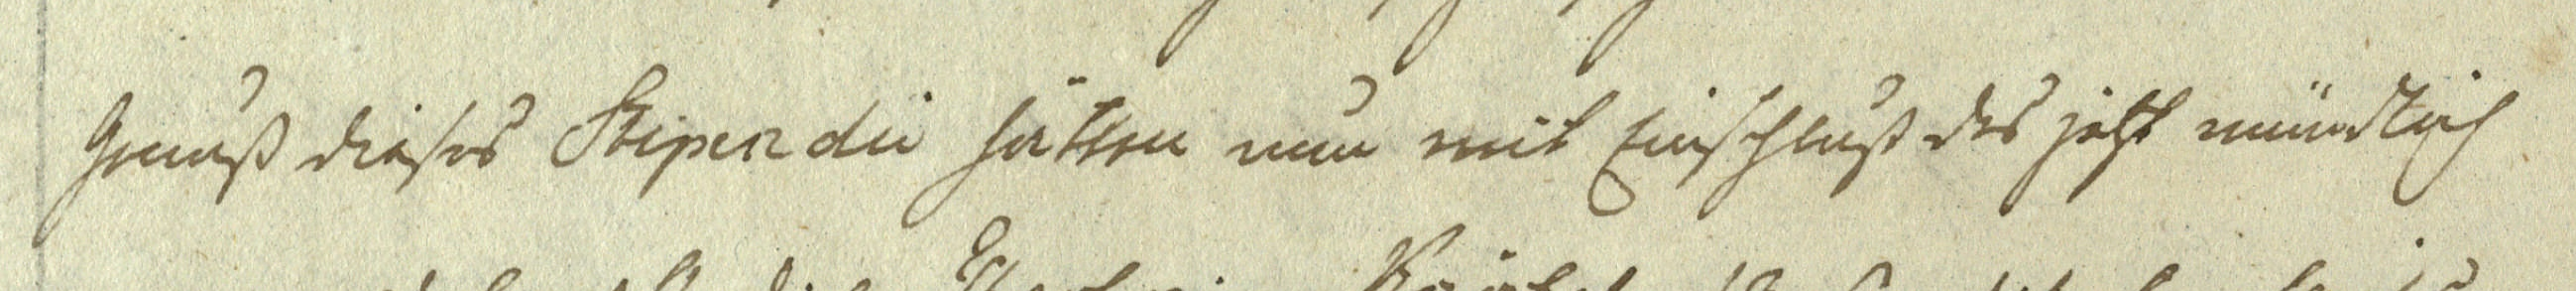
Genuß dieses Stipendii hätten nun mit Einschluß des jetzt mündlich
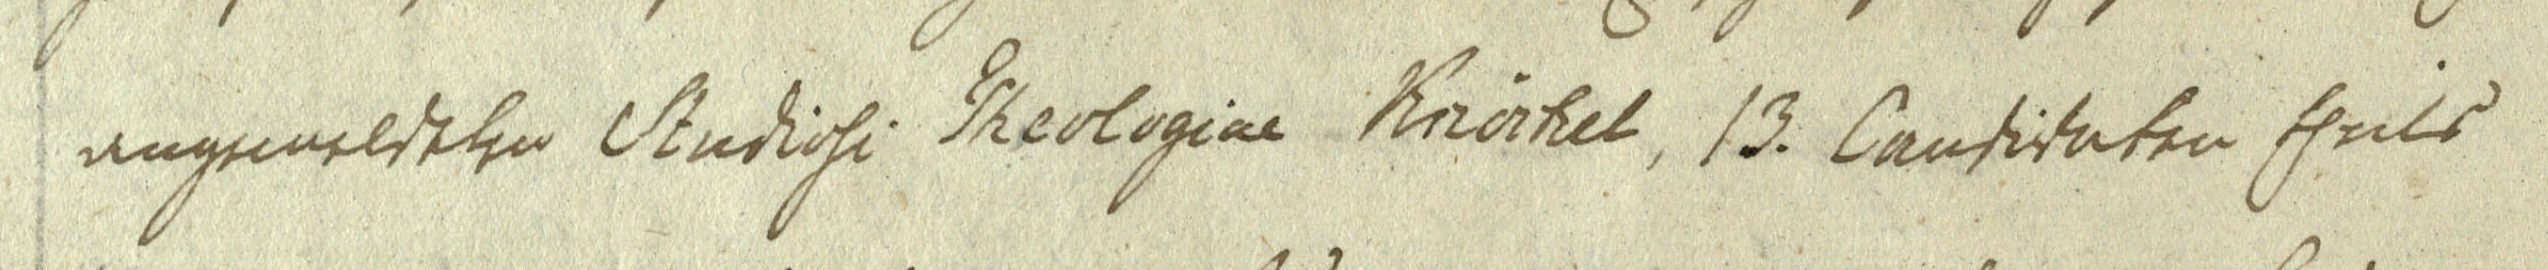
angemeldeten Studiosi Prectgioe Knöchel, 13. Candidaten theils
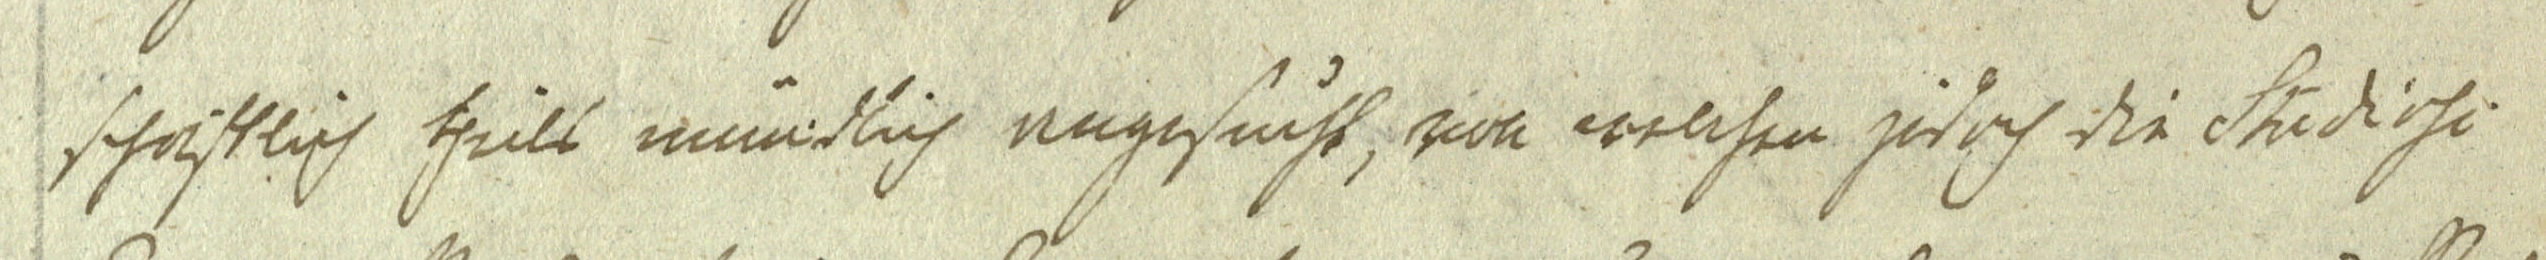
schriftlich theils mündlich angesucht, von welchen jedoch die Studiosi
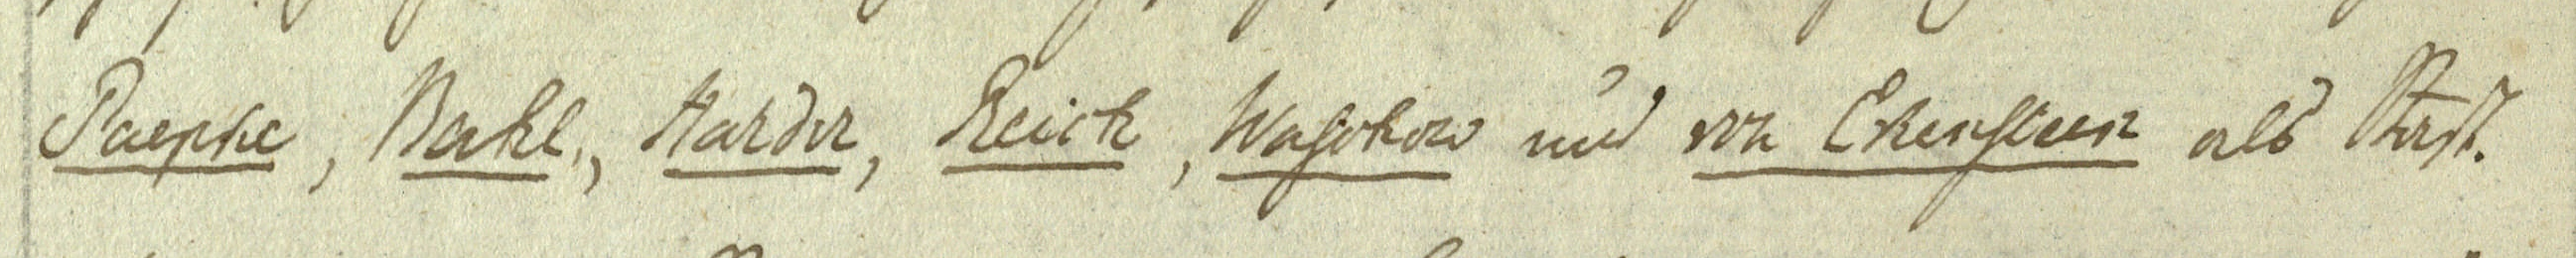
Paepke, Bahl, Harder, Reich, Waschow und von Exkensteen als Stadt¬
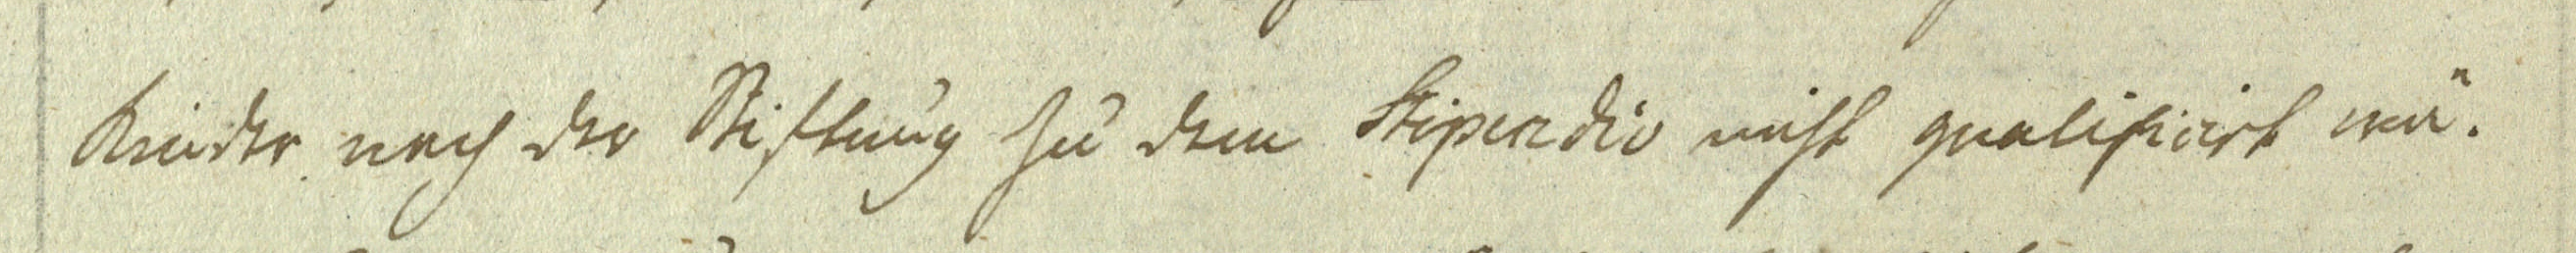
Kinder nach der Stiftung zu dem Stipendio nicht qualificirt wä¬
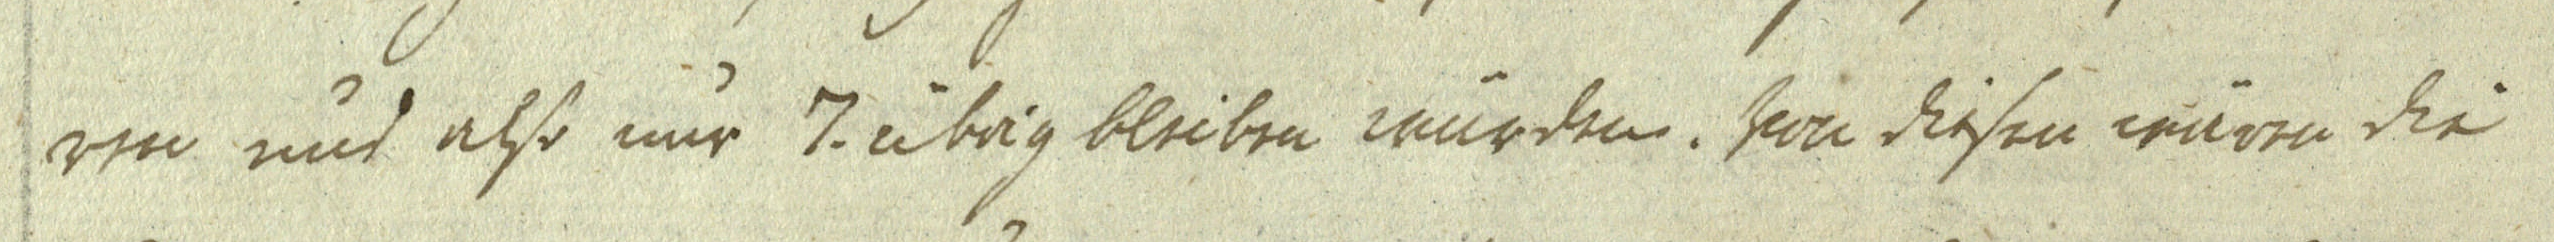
ren und also nur 7. übrig bleiben würden. Von diesen wären die
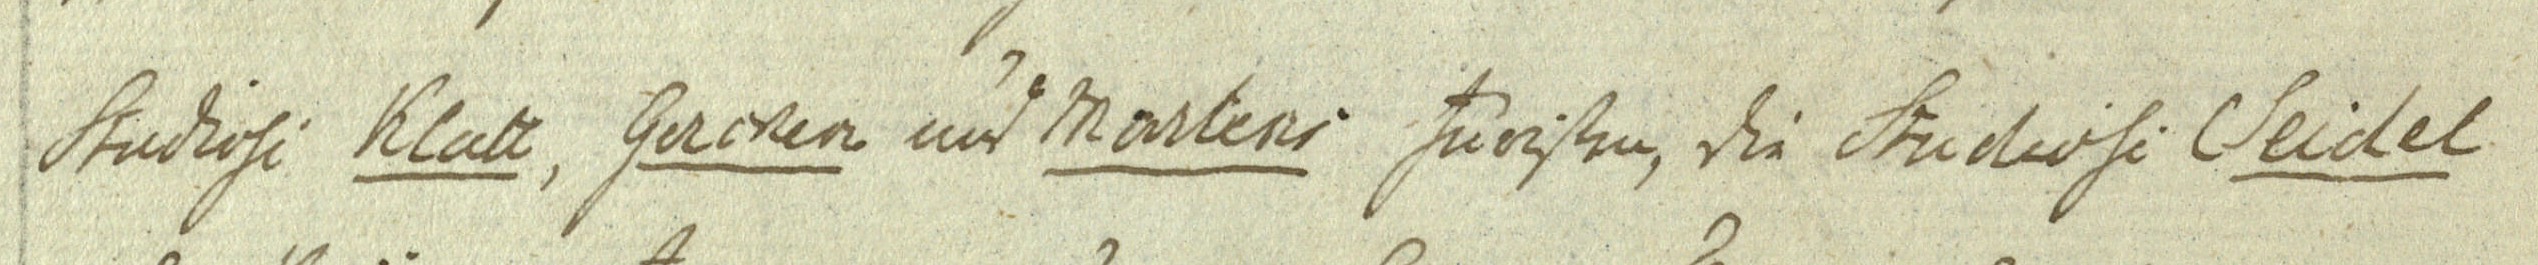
Studiosi Klatt, Gercken und Martens Juristen, die Studiosi Seidel
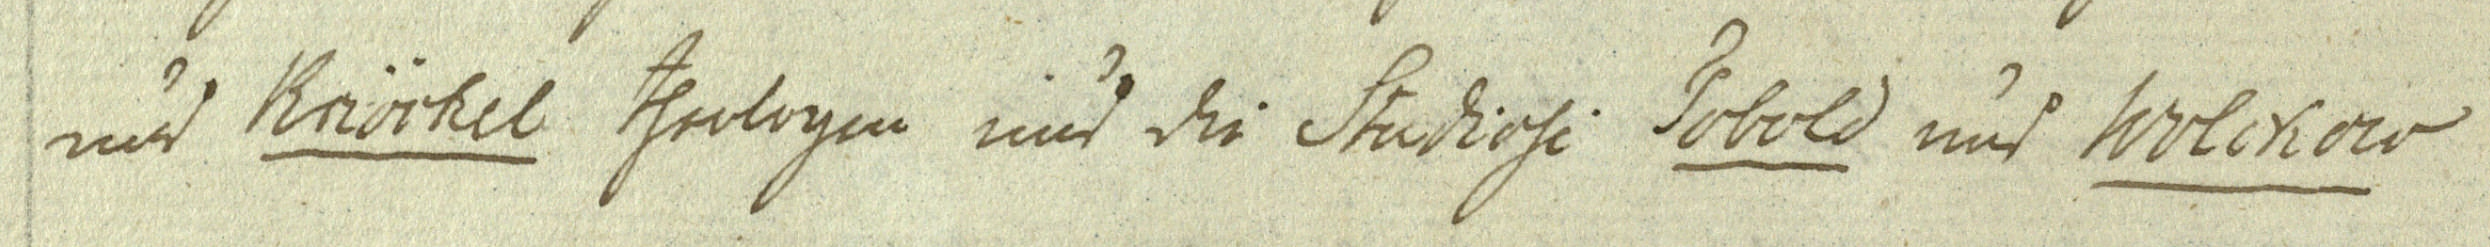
und Knöchel Theologen und die Studiosi Tobold und Wolckow
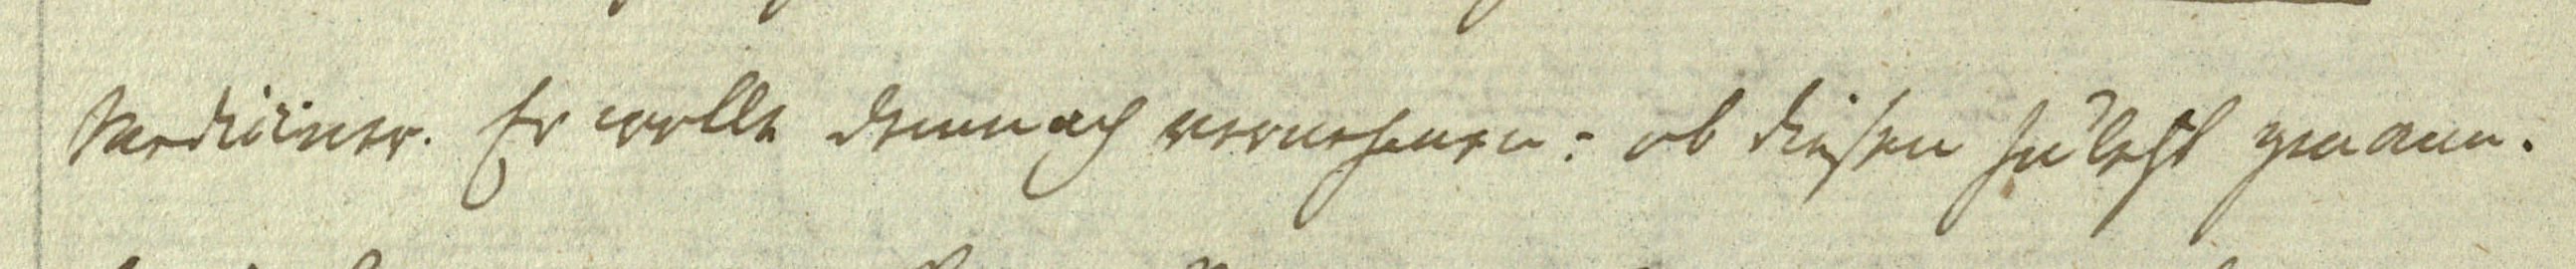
Mediciner. Er wolle demnach vernehmen: ob diesen zuletzt genann¬
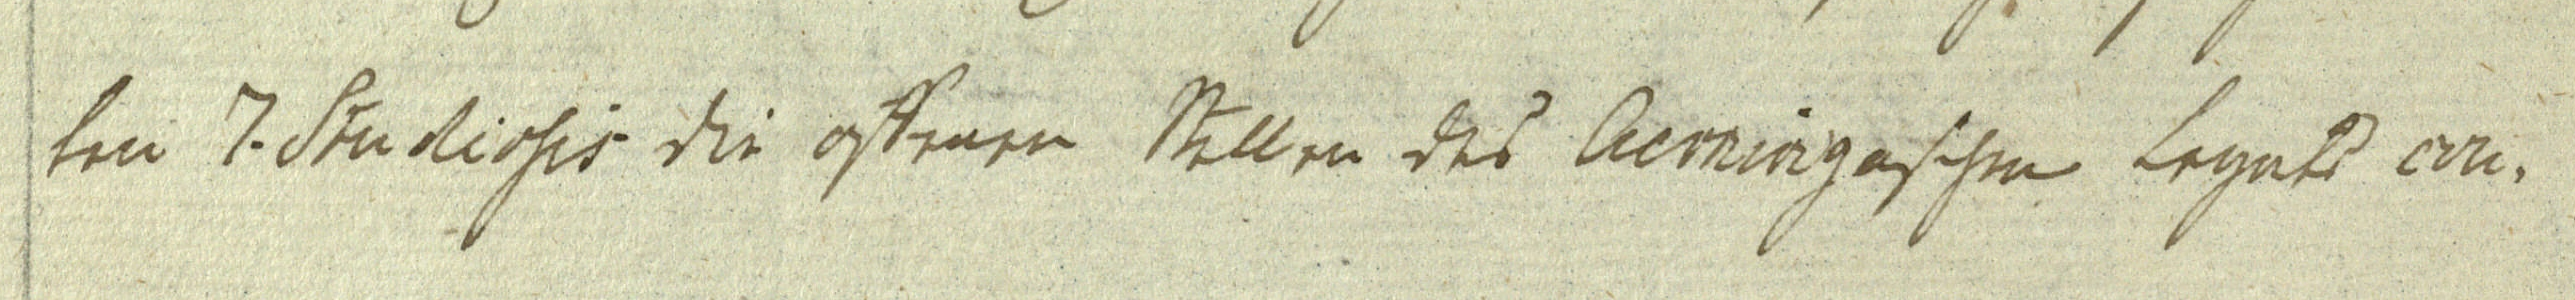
ten 7. Studiosis die offenen Stellen des Aemingaschen Legats con¬
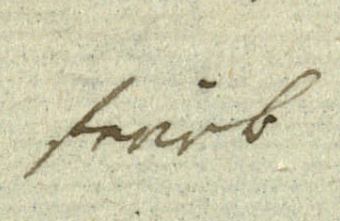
servirt
